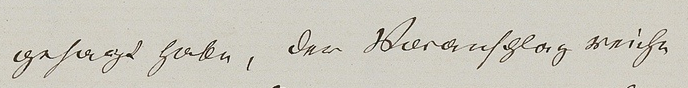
gesagt habe, der Voranschlag reiche
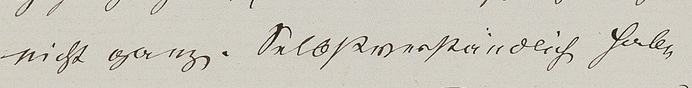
nicht ganz. Selbstverständlich habe
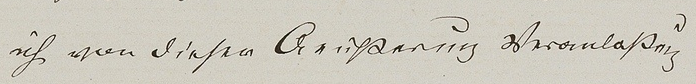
ich von dieser Aueßerung Veranlaßung
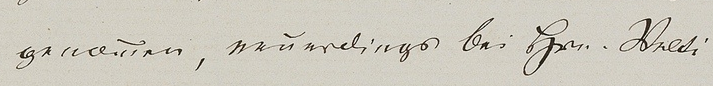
genommen, neuerdings bei Hrn. Welti
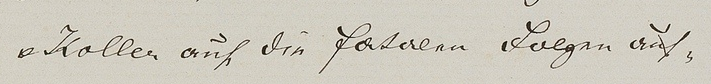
& Koller auf die fatalen Folgen auf-
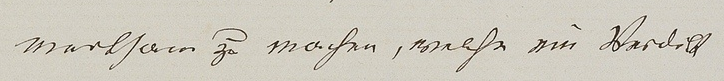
merksam zu machen, welche ein Verdikt
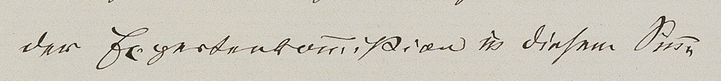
der Expertenkommißion in diesem Sinne
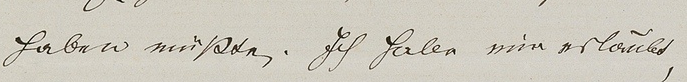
haben müßte. Ich habe mir erlaubt,
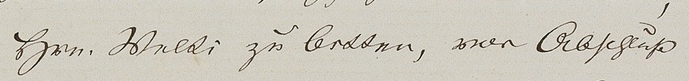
Hrn. Welti zu bitten, vor Abschluß
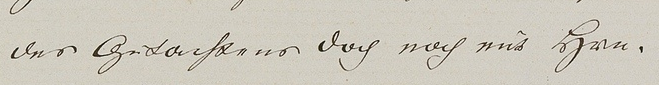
des Gutachtens doch noch mit Hrn.
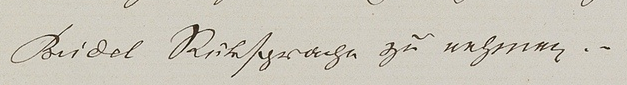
Bridel Rüksprache zu nehmen. –
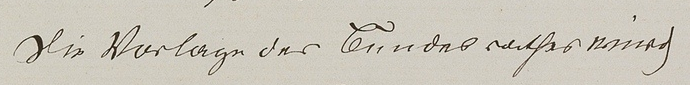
Die Vorlage des Bundesrathes wird
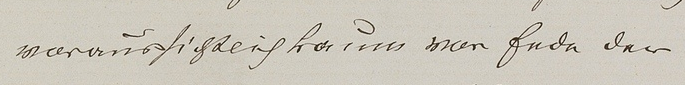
voraussichtlich kaum vor Ende der
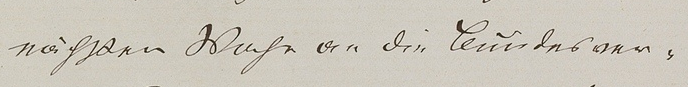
nächsten Woche an die Bundesver-
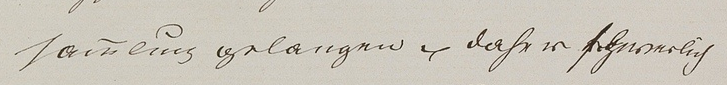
sammlung gelangen & daher schwerlich
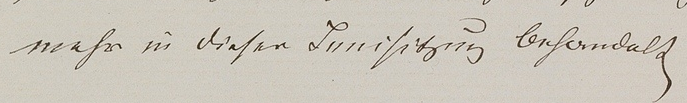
mehr in dieser Junisitzung behandelt
